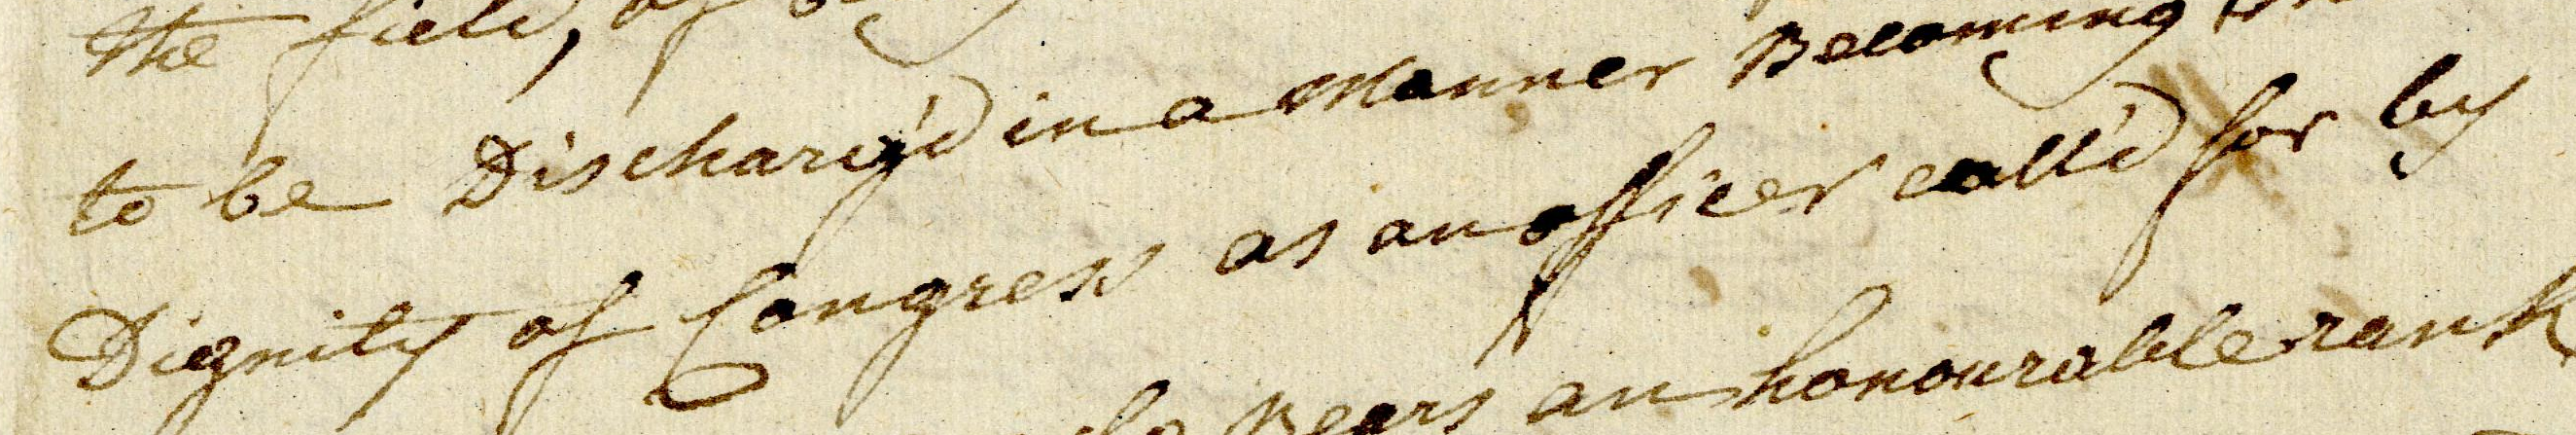Dignity of Congress as an officer call'd for by
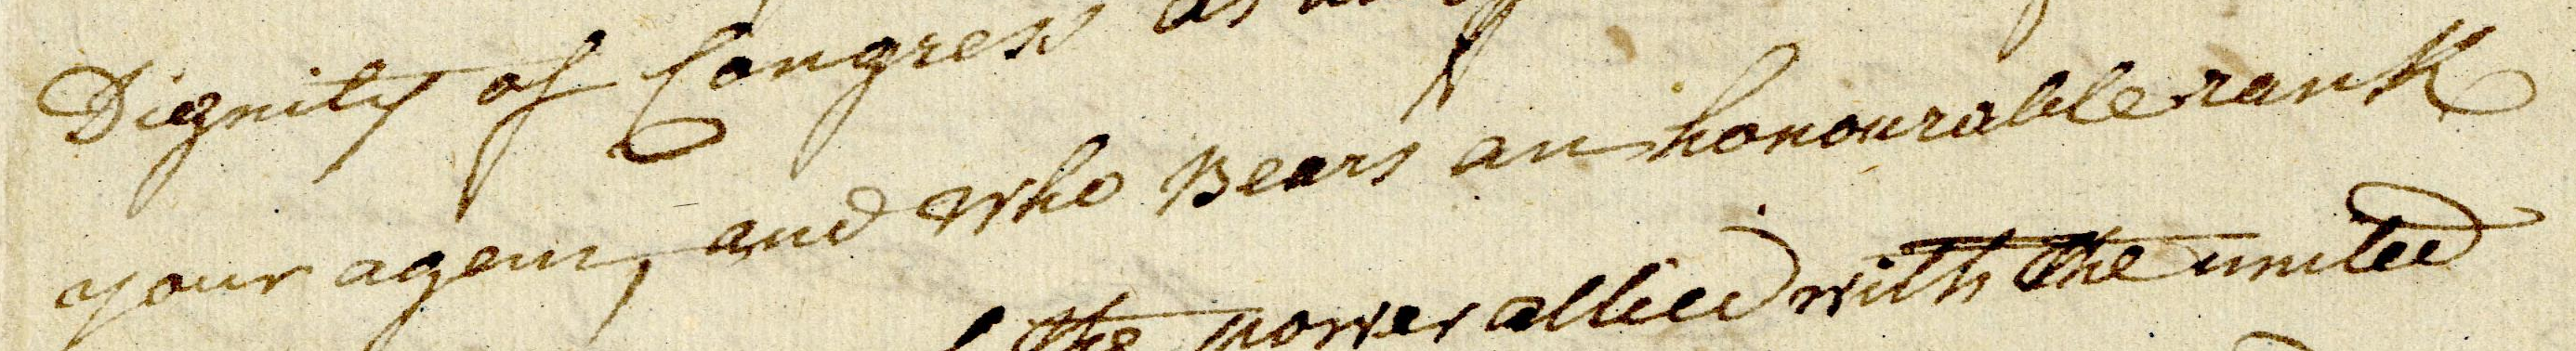your agent, and who bears an honourable rank
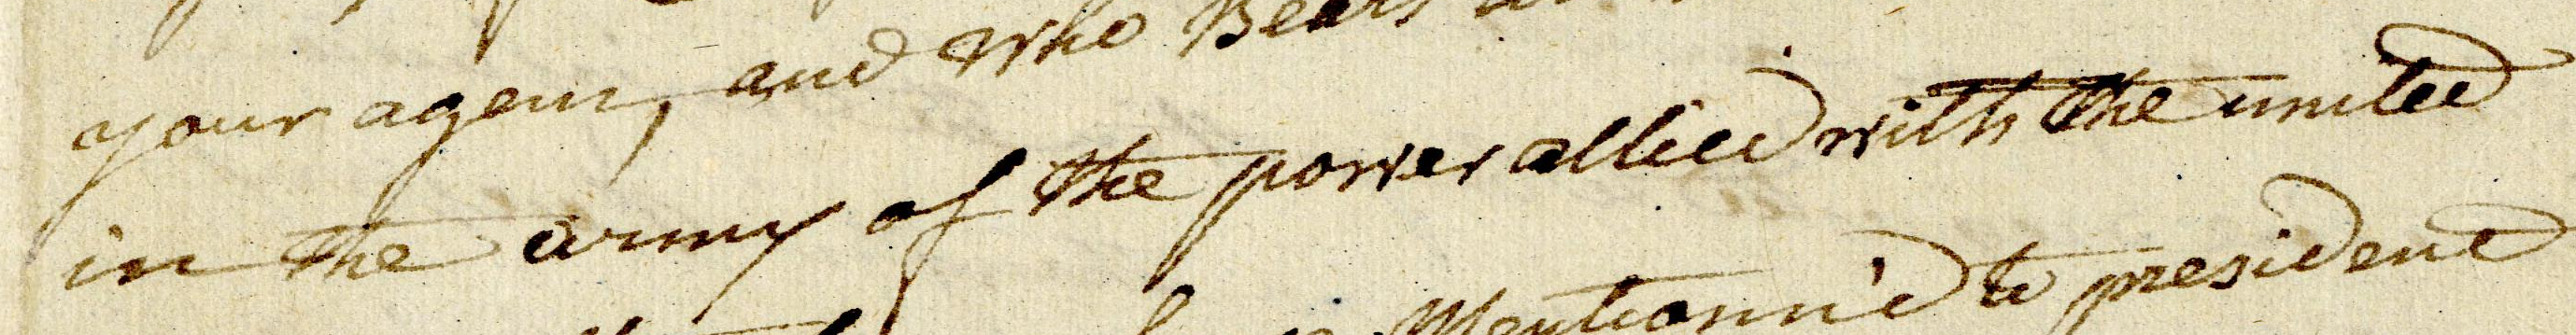in the army of the power allies with the united
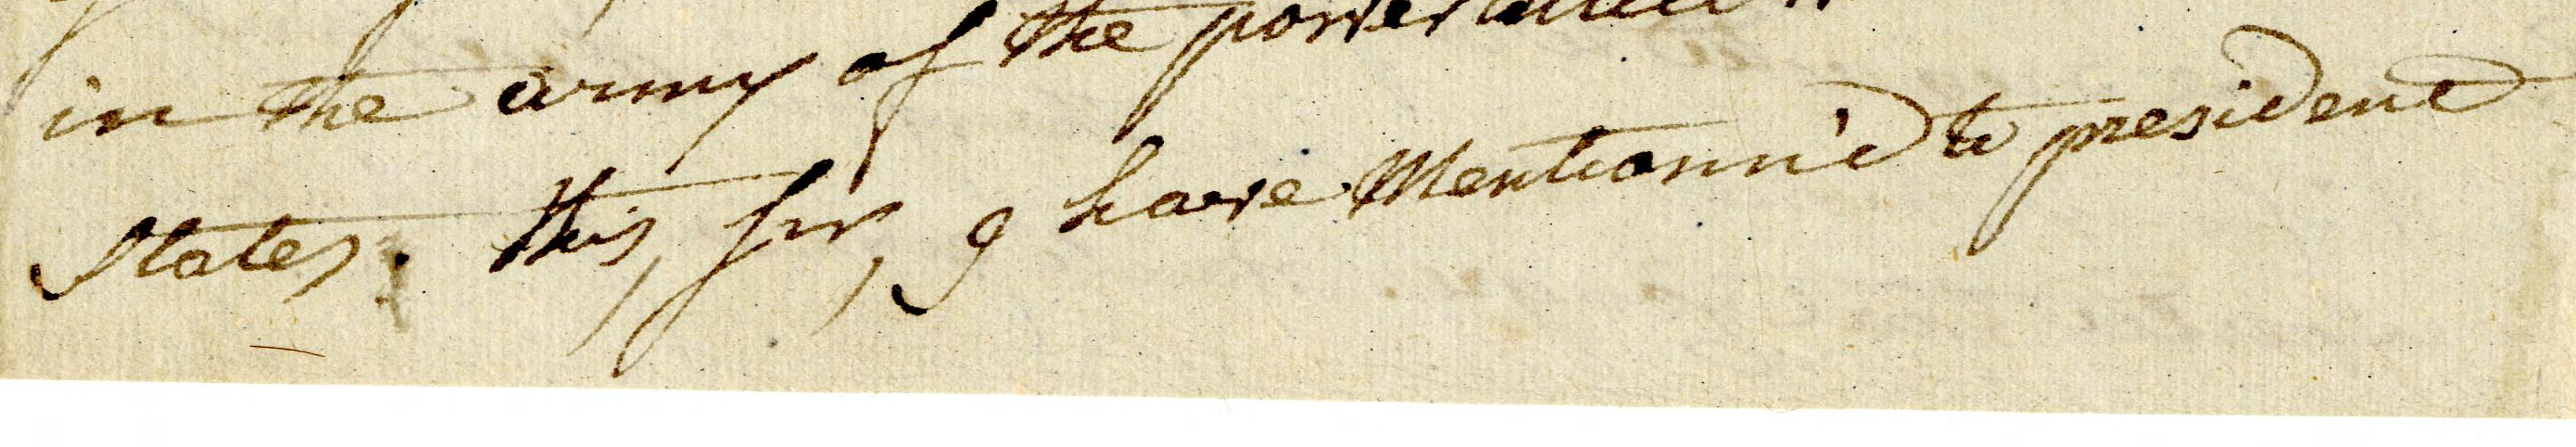States. this, sir, I have mention'd to president
